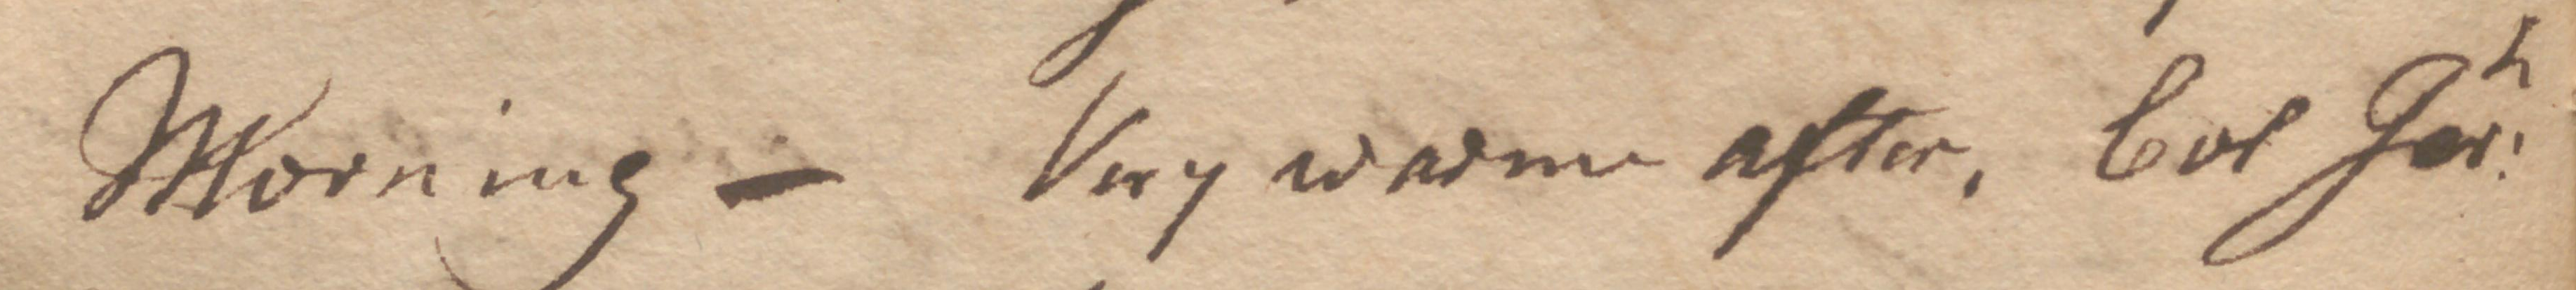Morning- Very warme after, Col Jos^h.
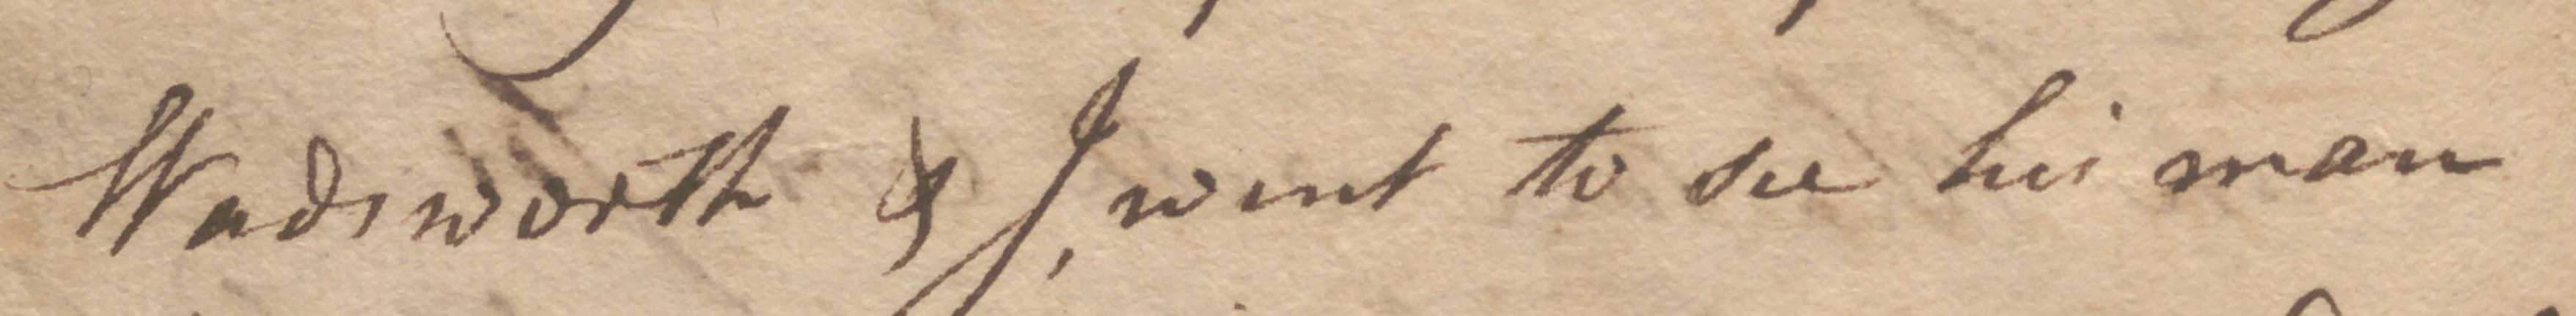Wadsworth & I went to see his man
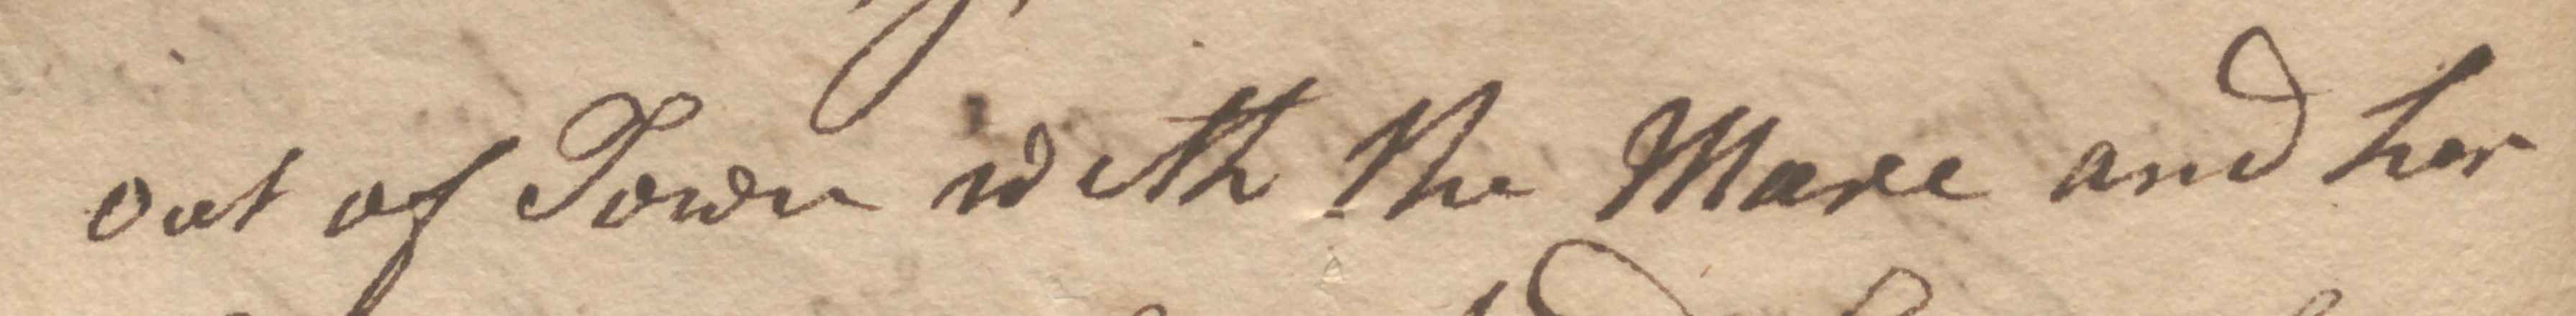out of Town with the Mare and her
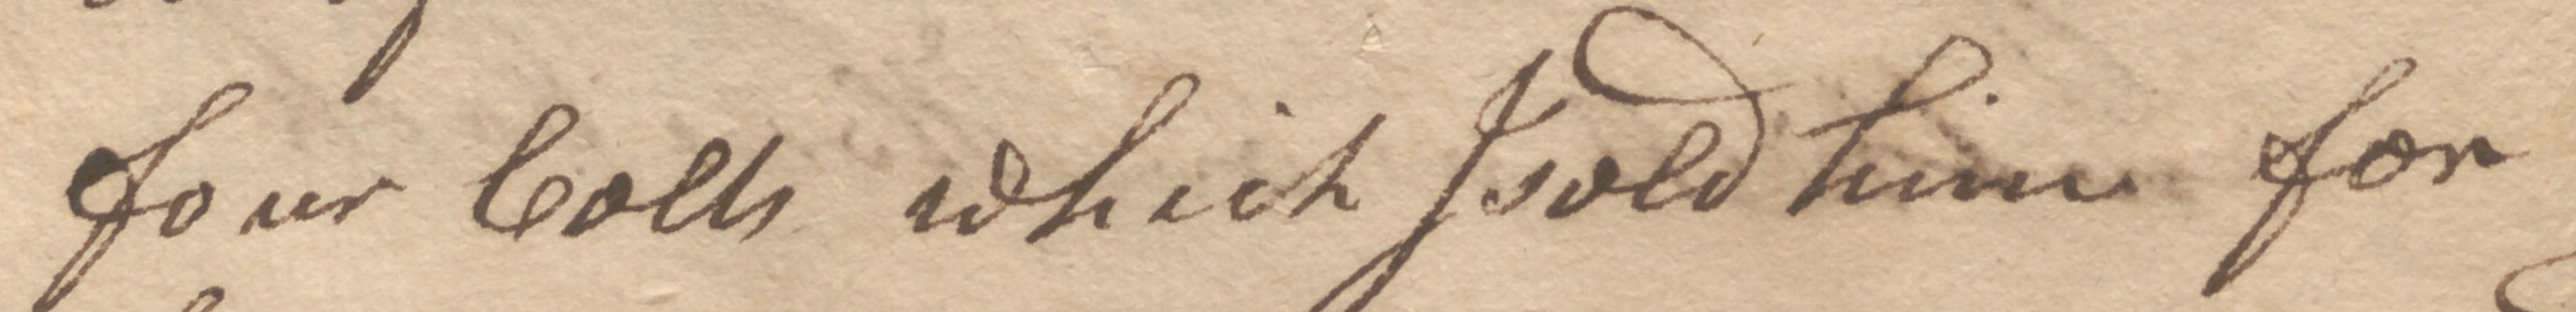four Colts which I sold him for
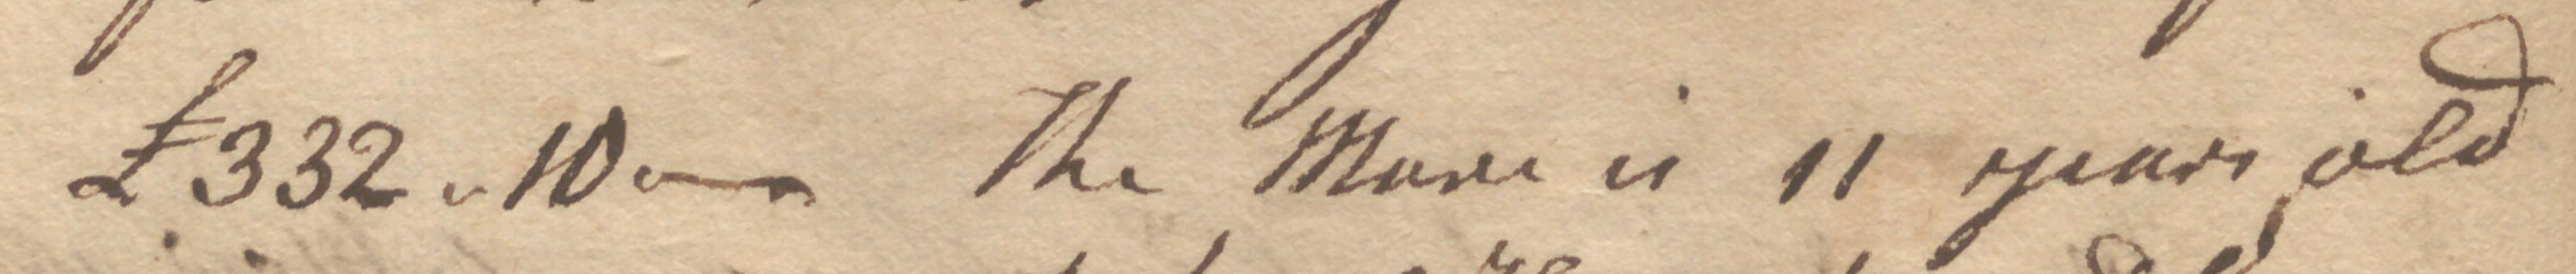£332.10- the Mare is 11 years old
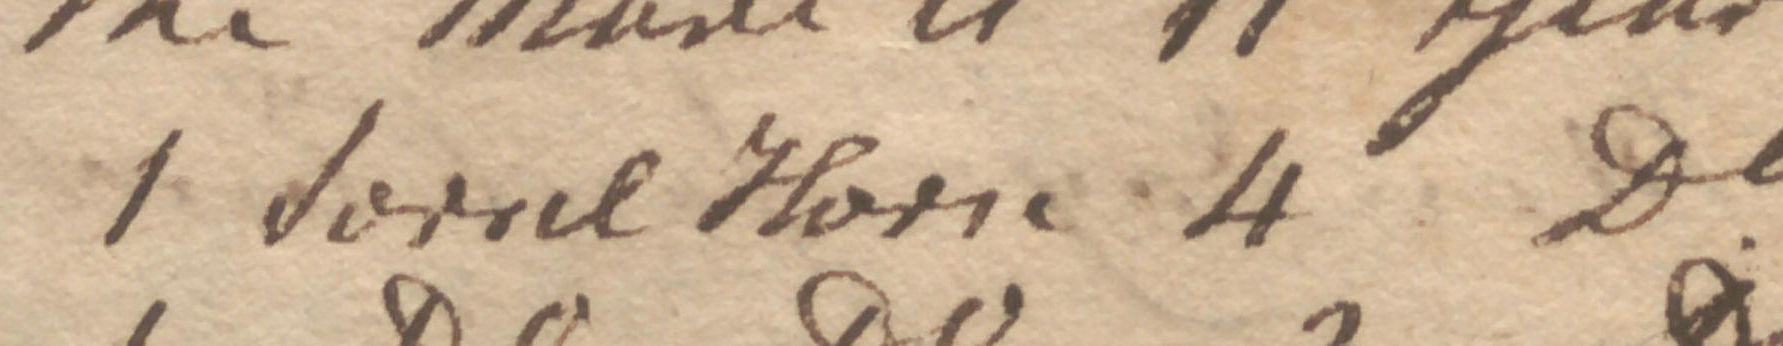1 Sorrel Horse 4 D^o.
